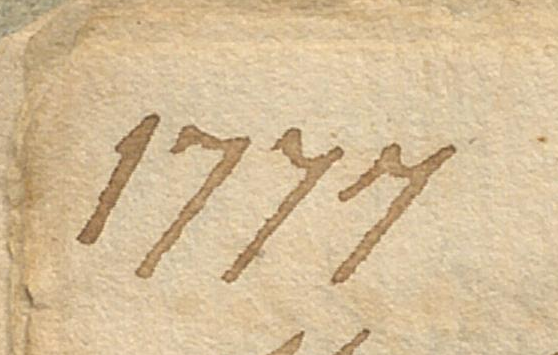1777
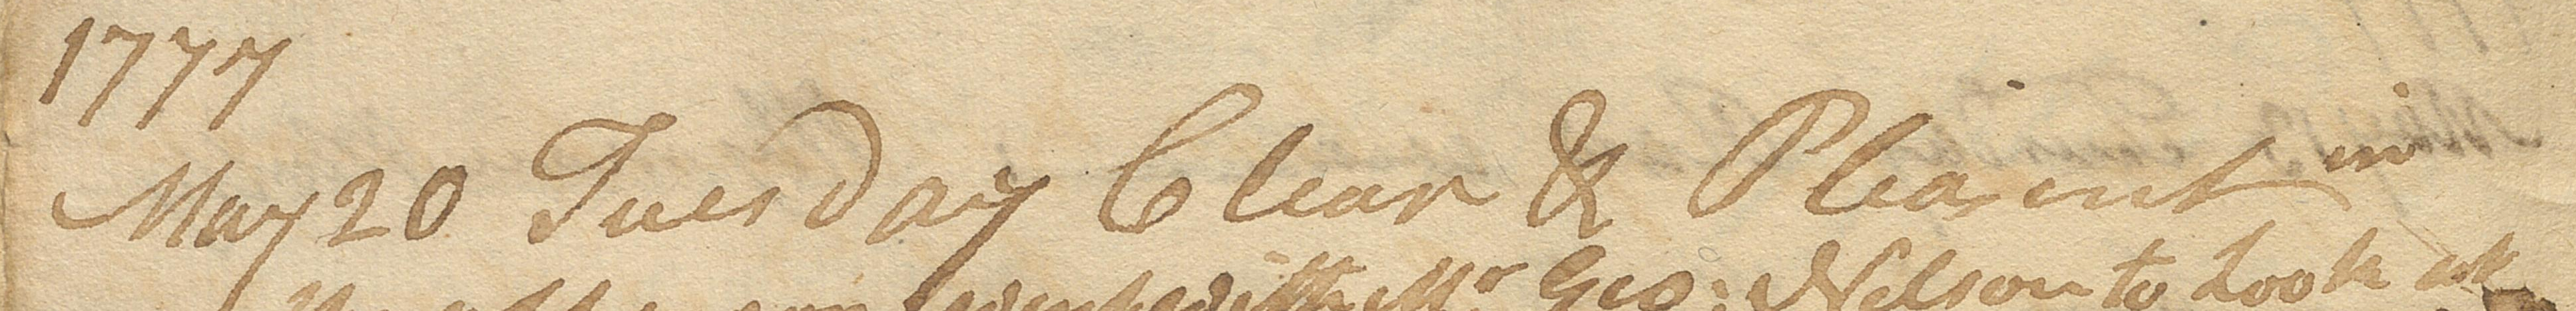May 20 Tuesday Clear & Pleaent in
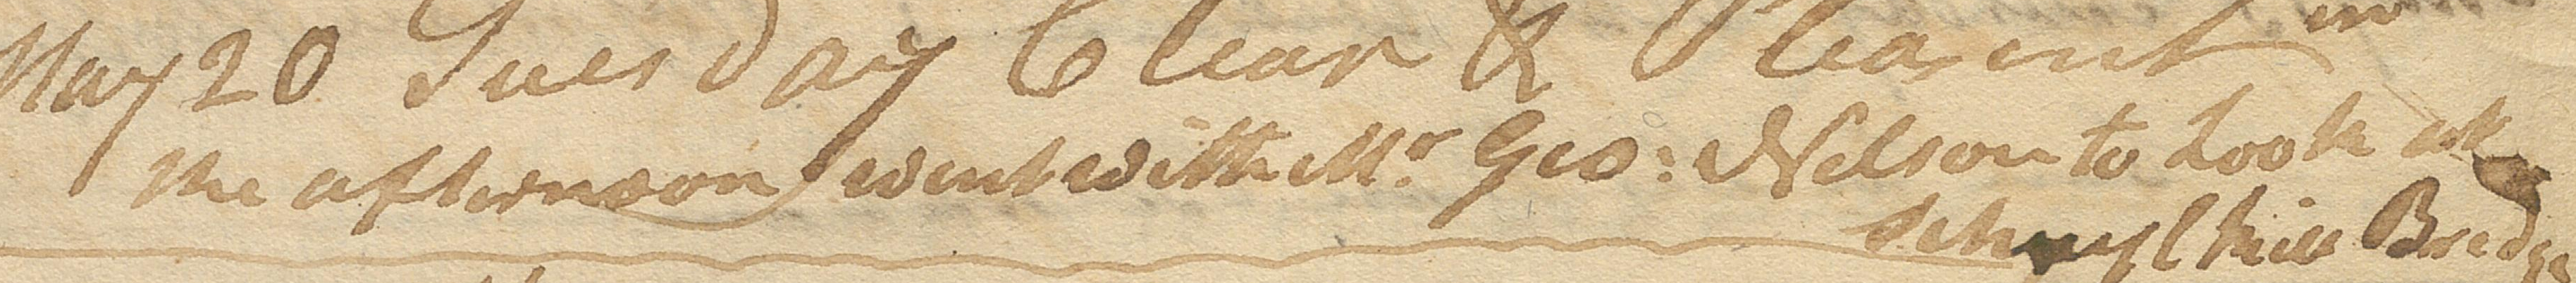the afternoon went with M^r. Geo: Nelson to Look at
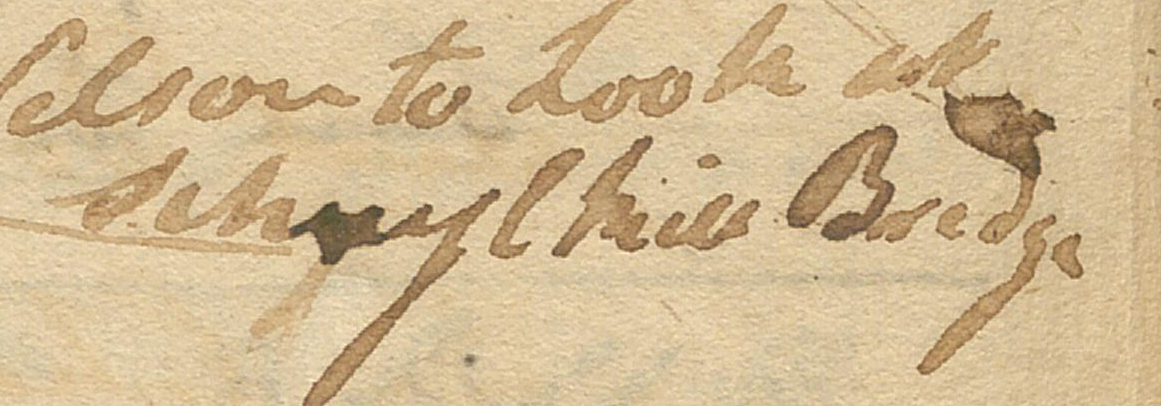Schuylkill Bridge
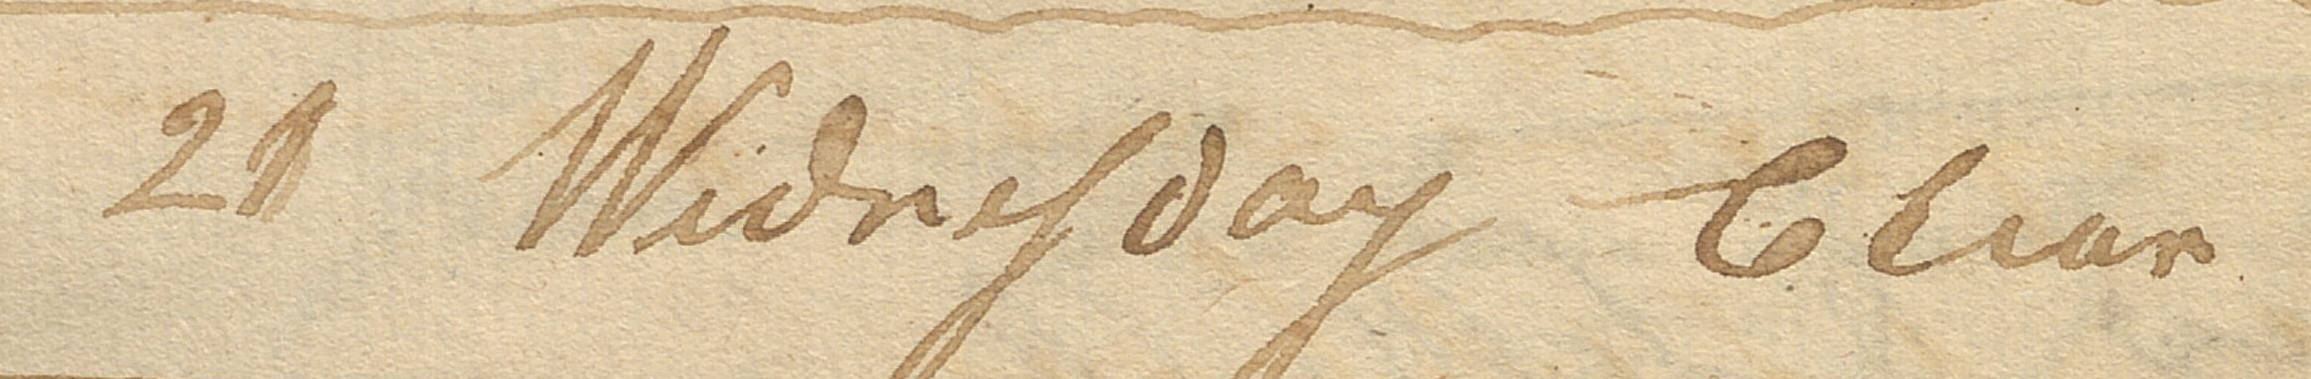21 Wednesday Clear
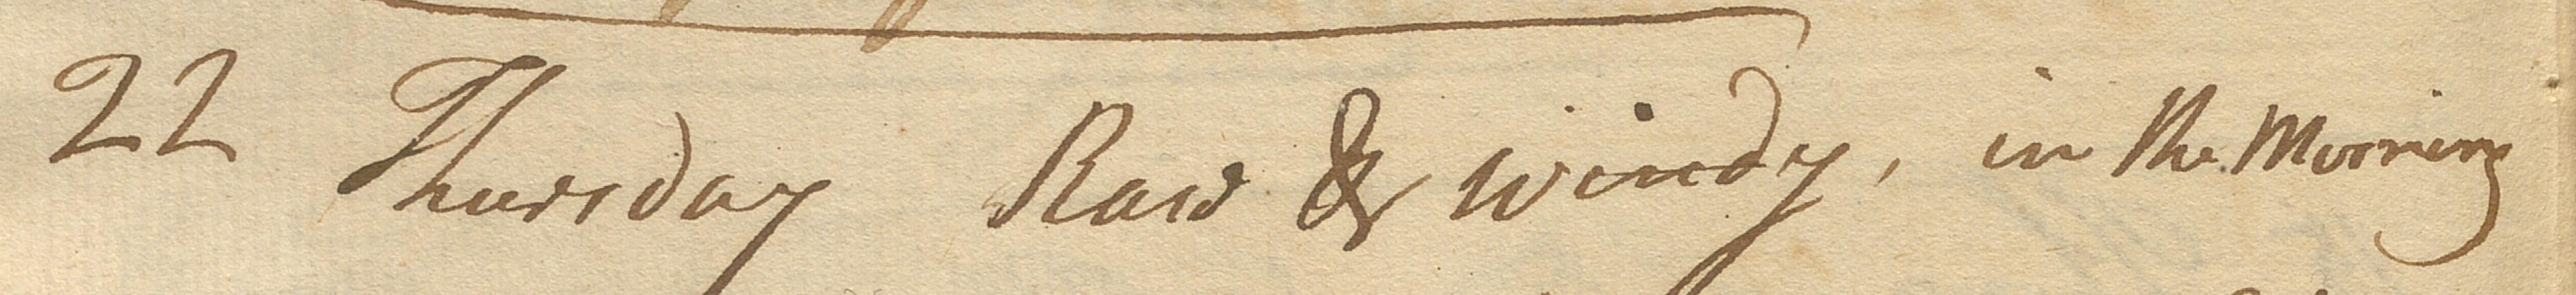22 Thursday Raw & windy, in the Morning
